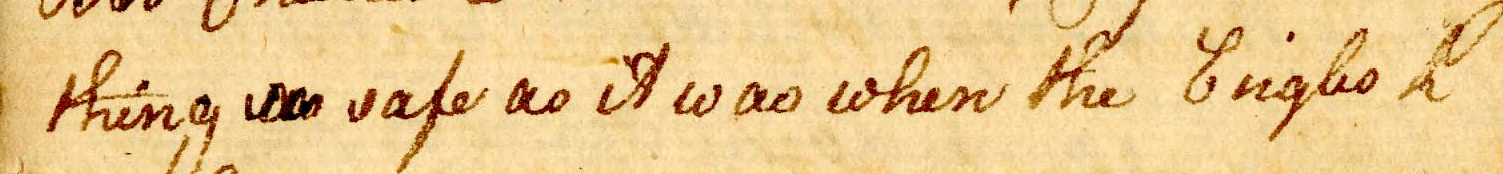thing [__] safe as it was when the English
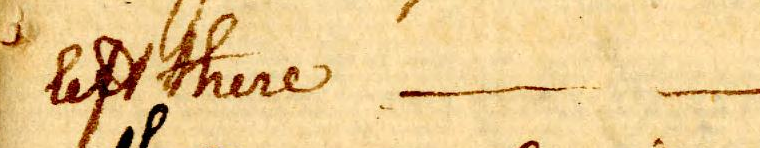left there-
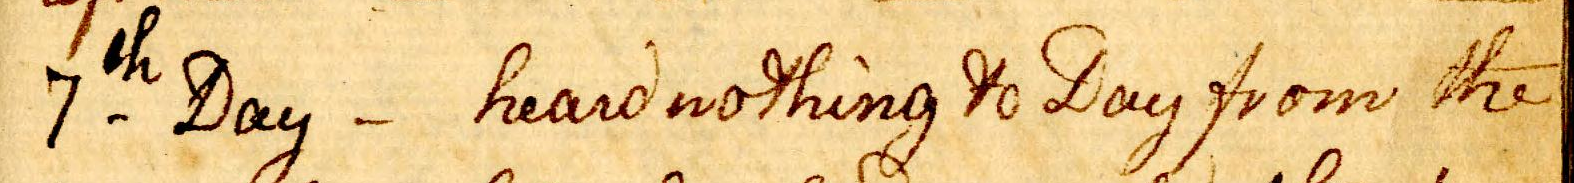7^th Day- heard nothing to Day from the
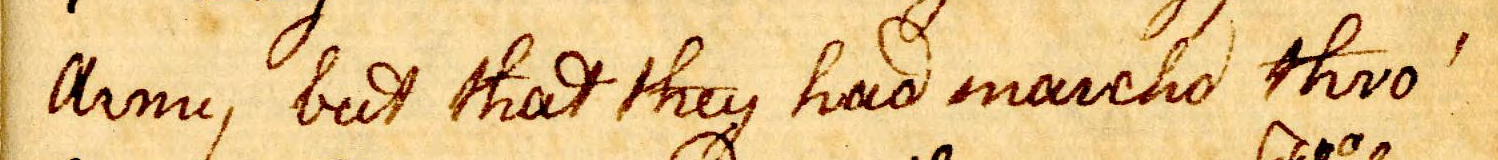Army but that they had marchd thro'
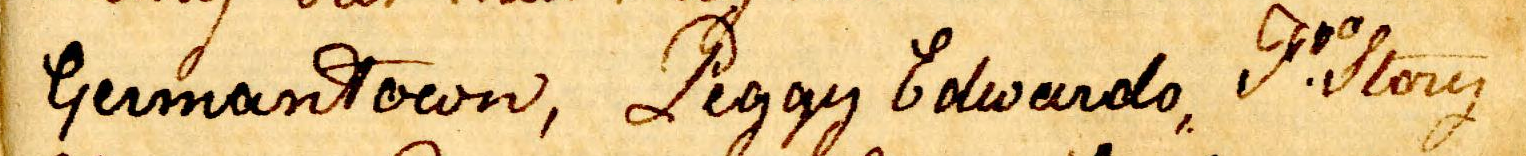Germantown, Peggy Edwards, [F^ro] Story
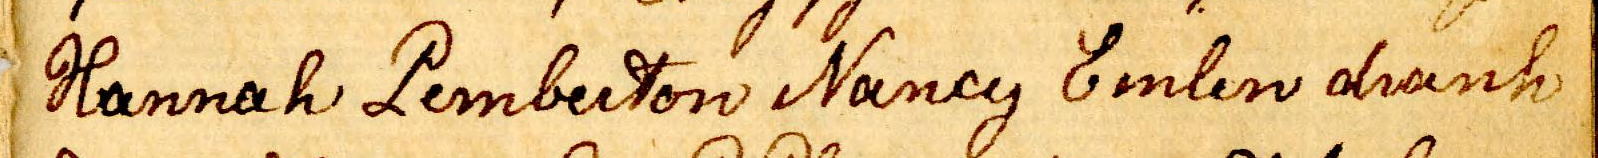Hannah Pemberton Nancy Emlen drank
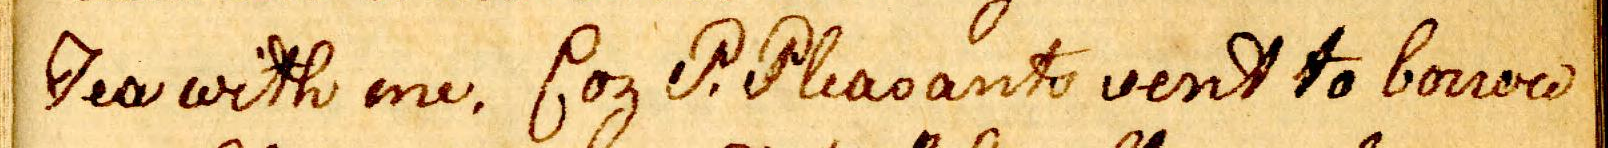Tea with me. Coz P. Pleasants sent to borrow
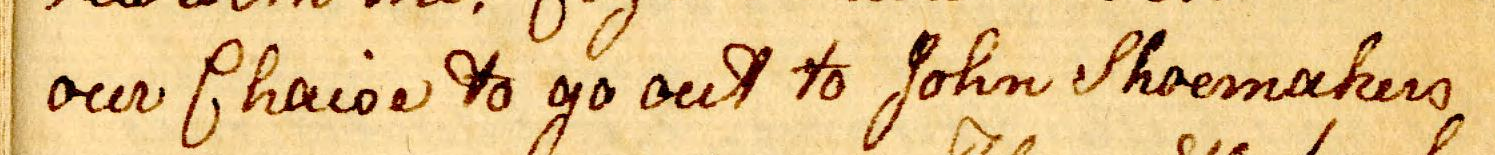our Chaise to go out to John Shoemakers
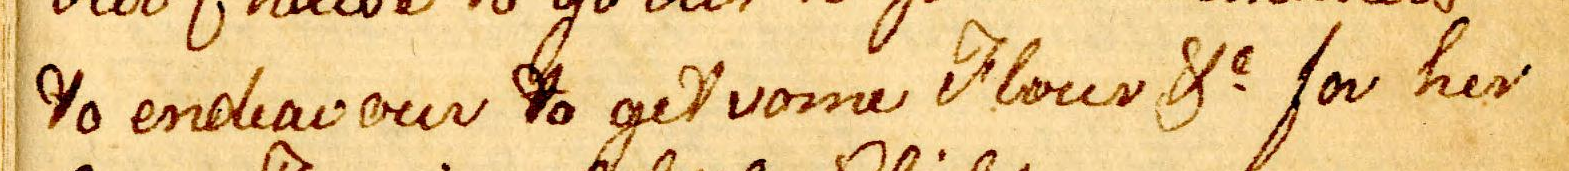to endeavour to get some Flour &^c. for her
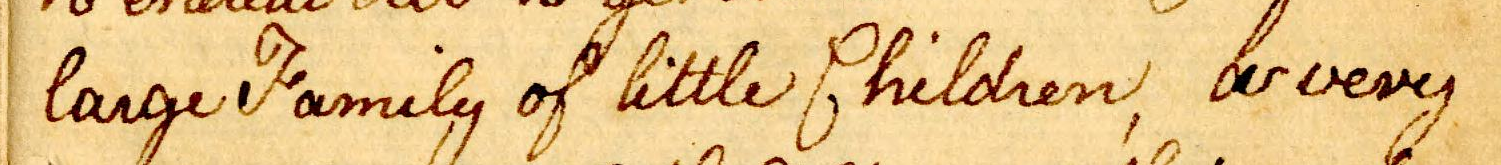large Family of little Children, a very
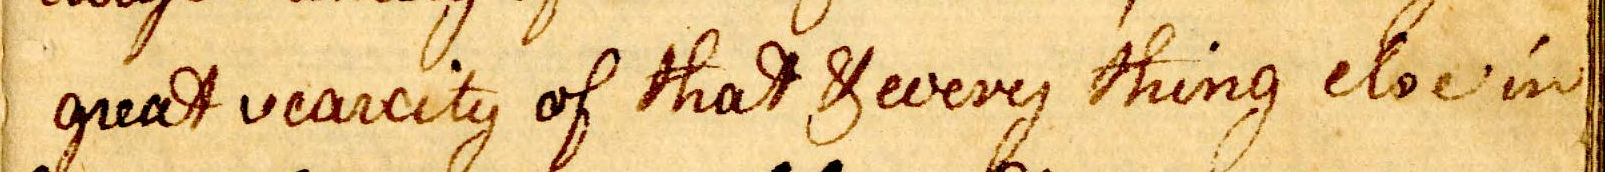great scarcity of that & every thing else in
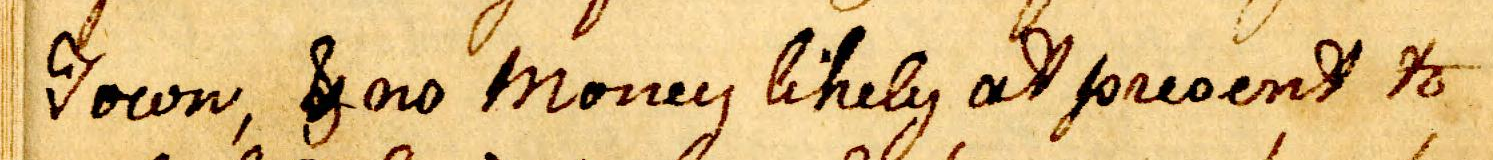Town, & no money likely at present to
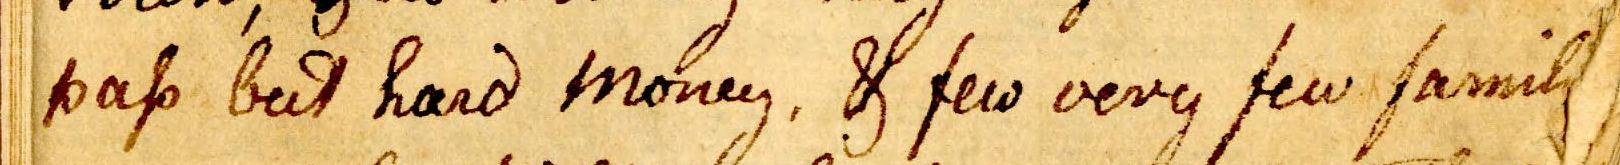pass but hard Money, & few very few famil
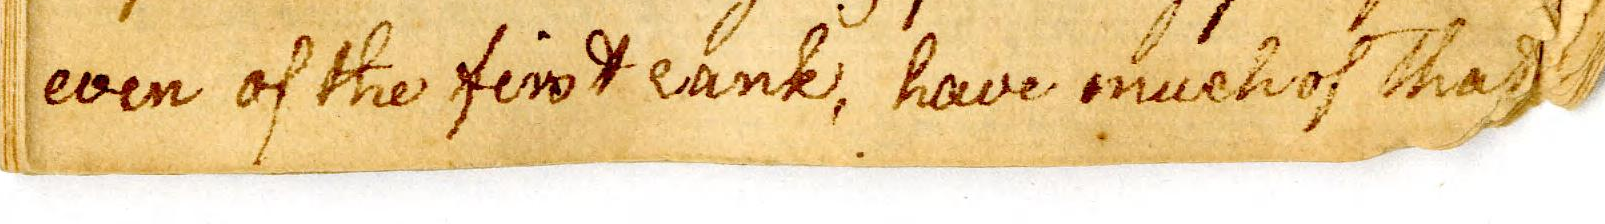even of the first rank, have much of that
